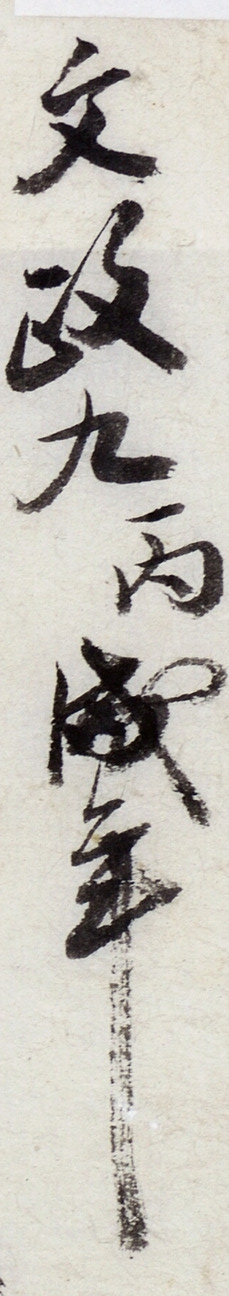文政九丙戌年
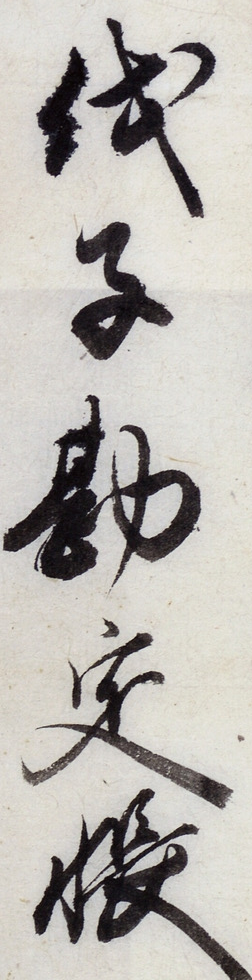伐子勘定帳
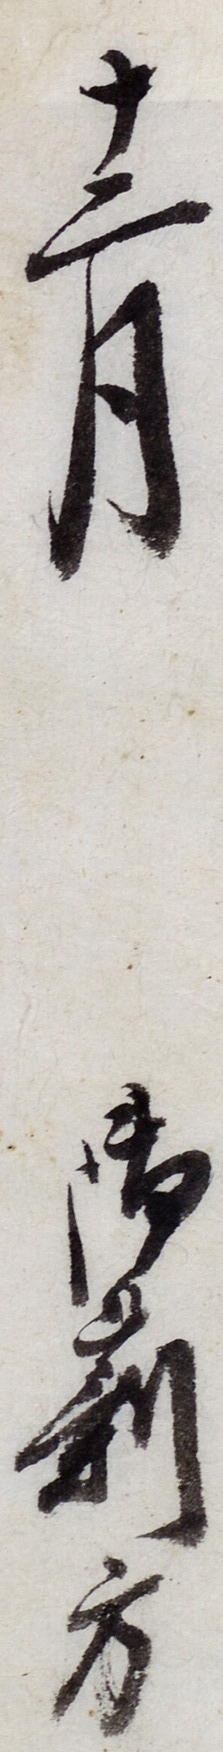十二月御薪方
